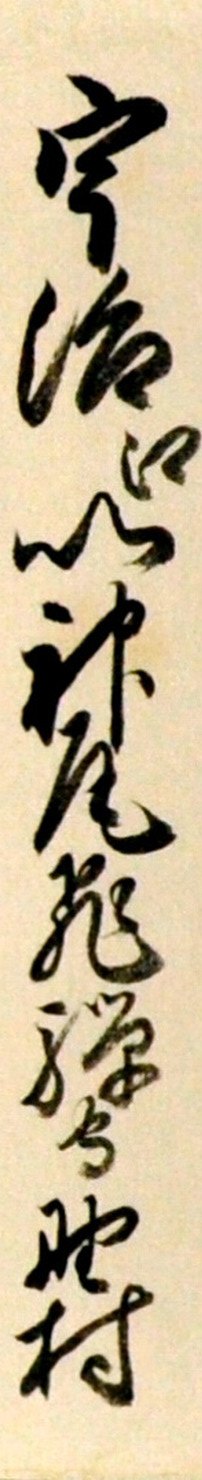宇治江以神尾飛騨守野村
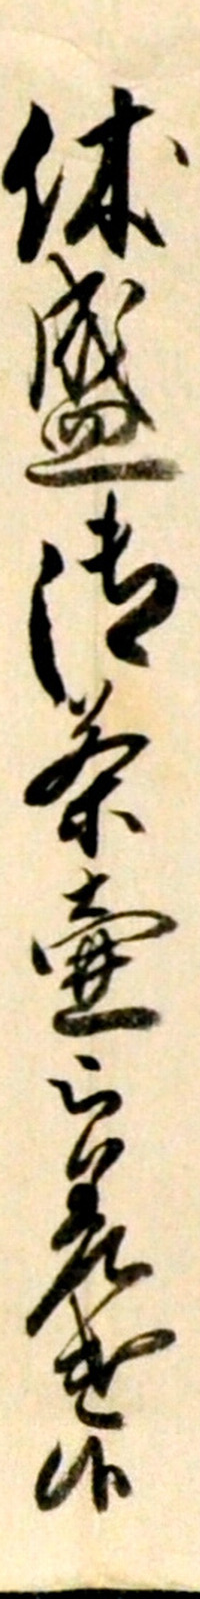休盛御茶壷被差遣候
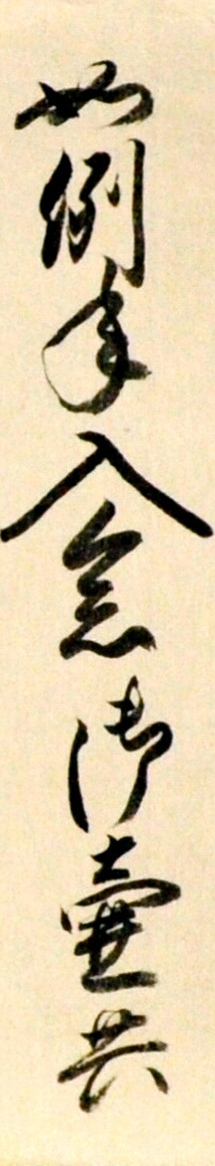如例年入念御壺共
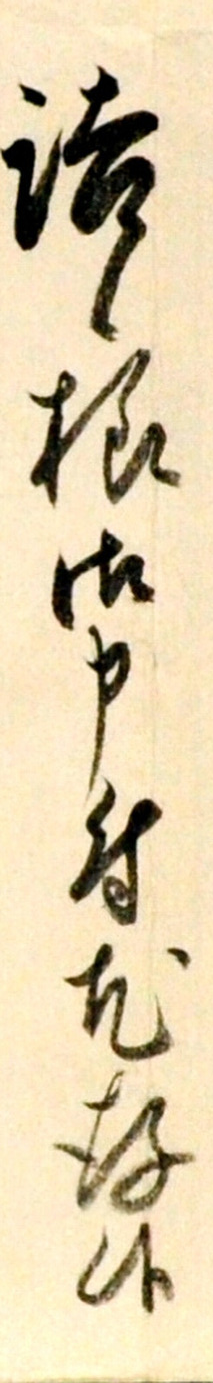詰候様御申付尤存候
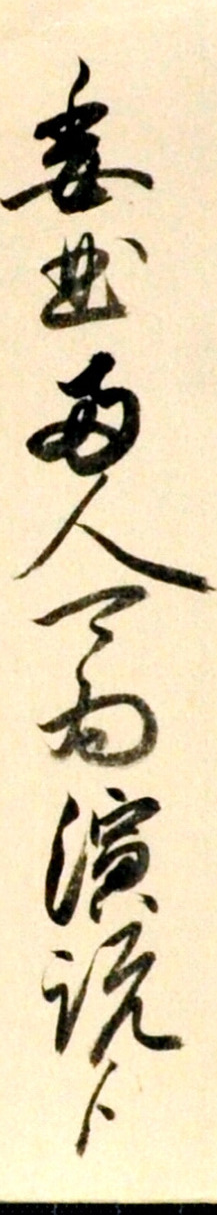委曲両人可為演説候
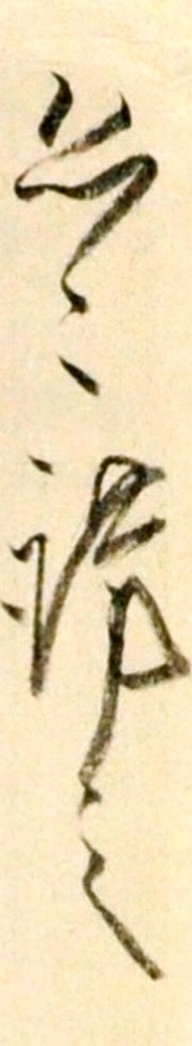恐々錺言
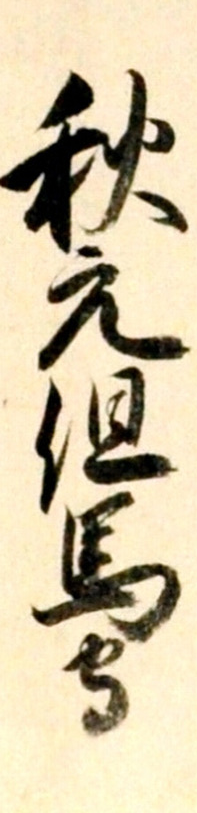秋元但馬守
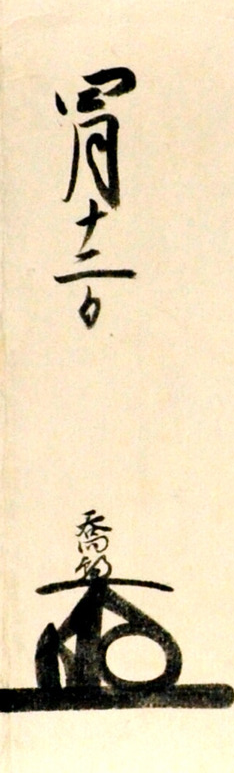四月十二日喬朝
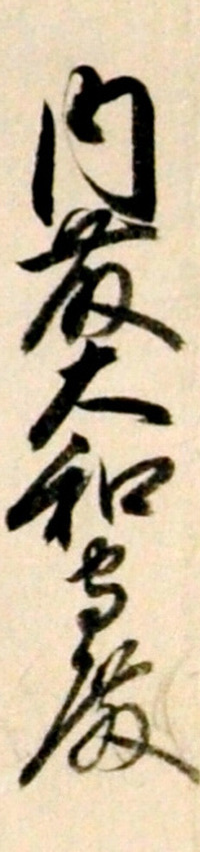内藤大和守殿
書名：書状
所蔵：伊那市立高遠町図書館・合同会社AMANE
